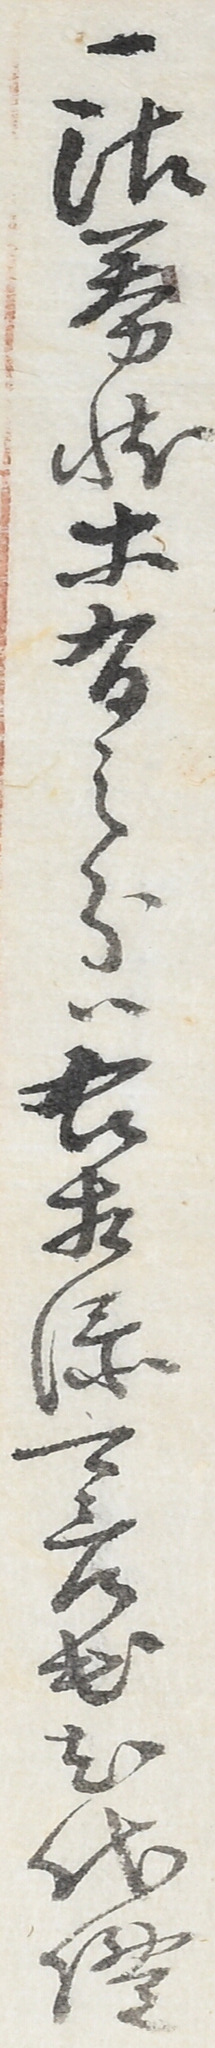一沽券状等有之分ハ右相添可差出尤代価

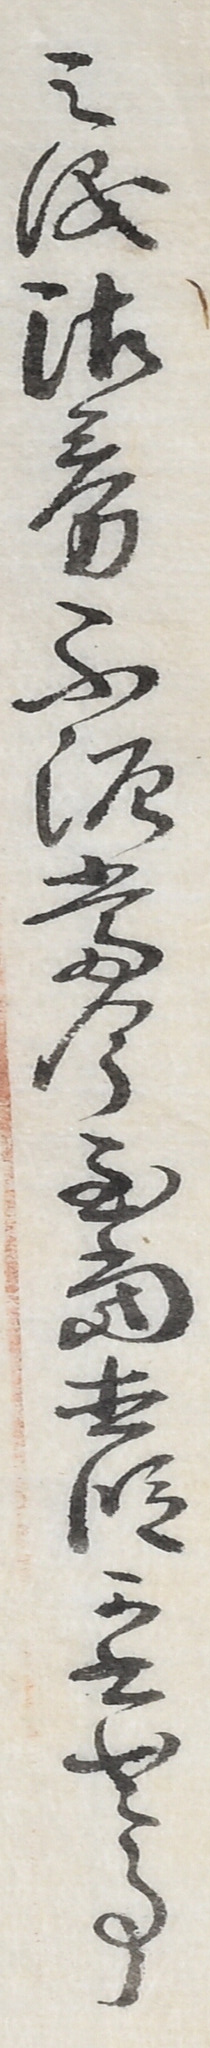之儀沽券不泥当今至当直段可書出事
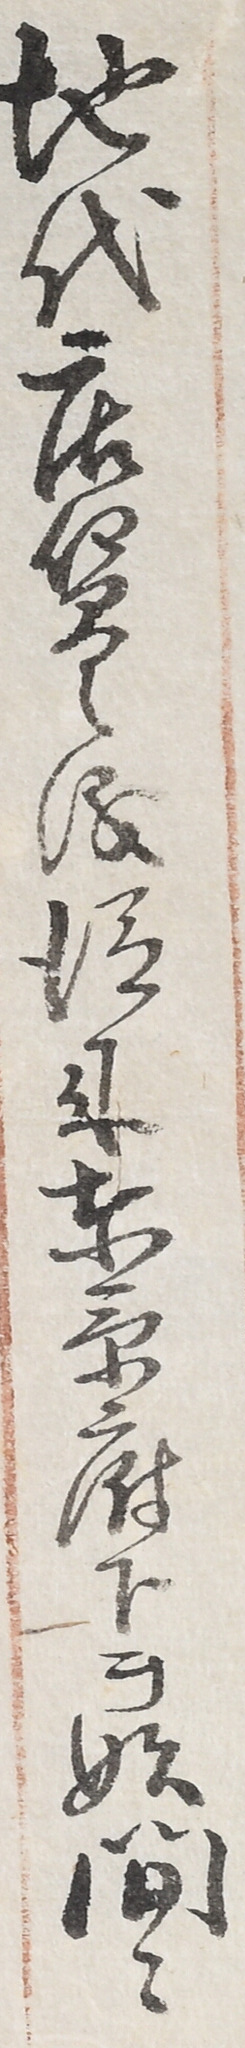地代店賃之儀従来東京府下ヲ始間々
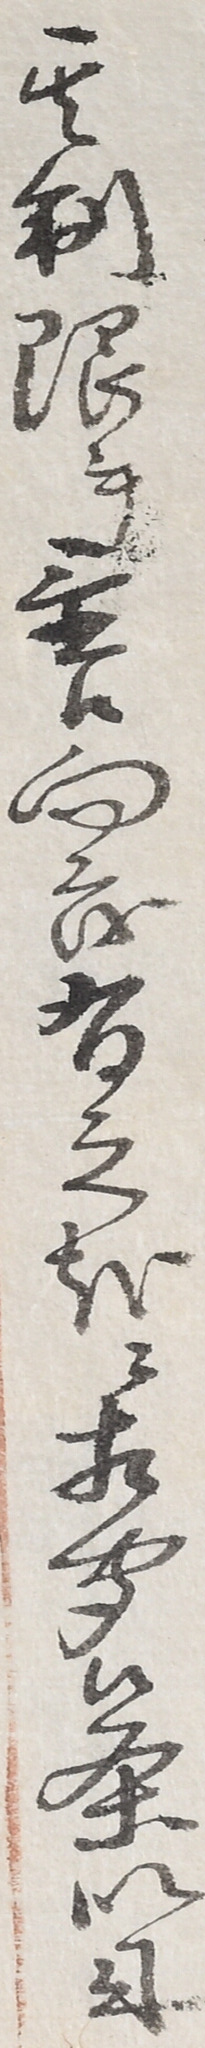其制限ヲ置候向も有之哉ニ相聞候条以来
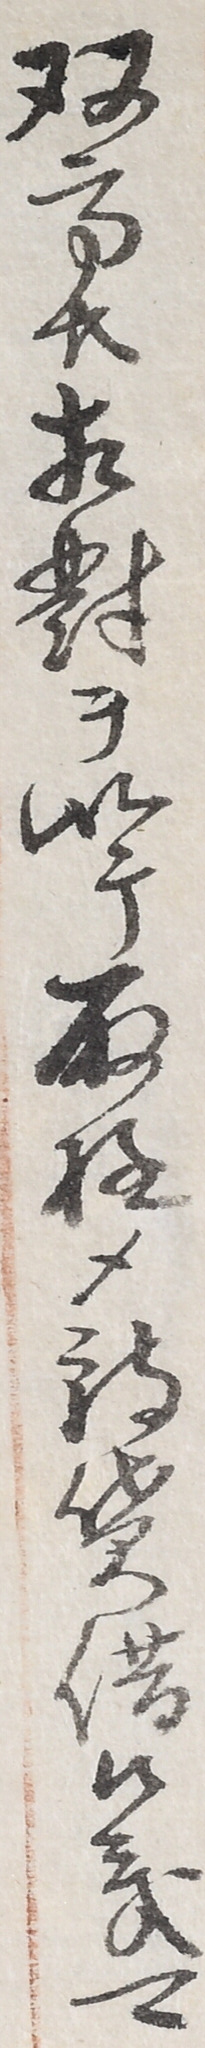双方共相対ヲ以テ取極メ致貸借候義可
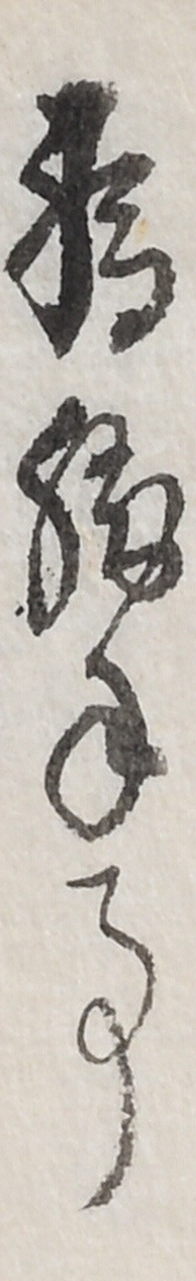為勝手事
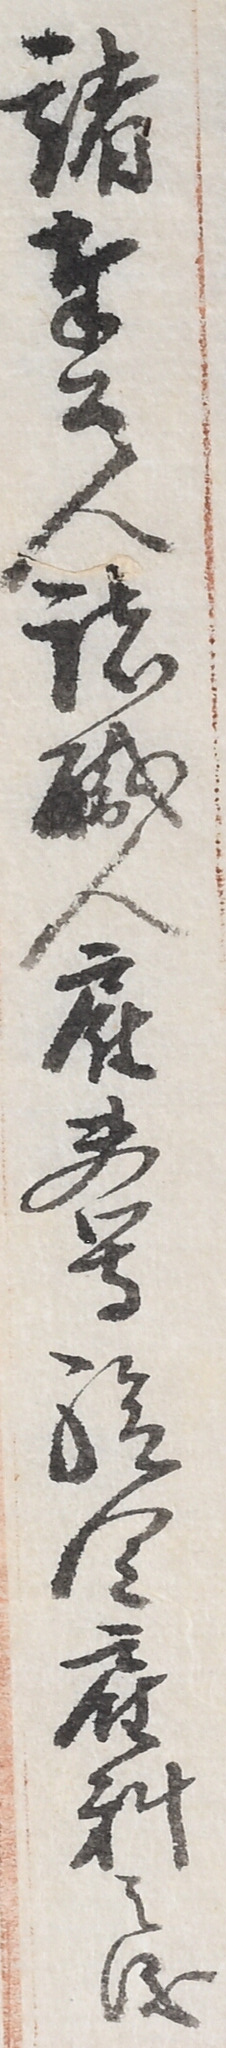諸奉公人諸職人雇夫等給金雇料之儀
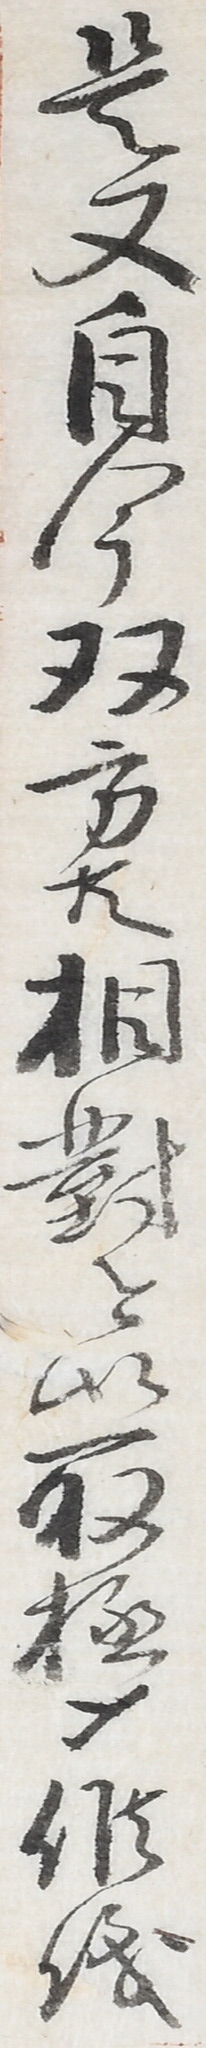是又自今双方共相対を以取極シメ候儀
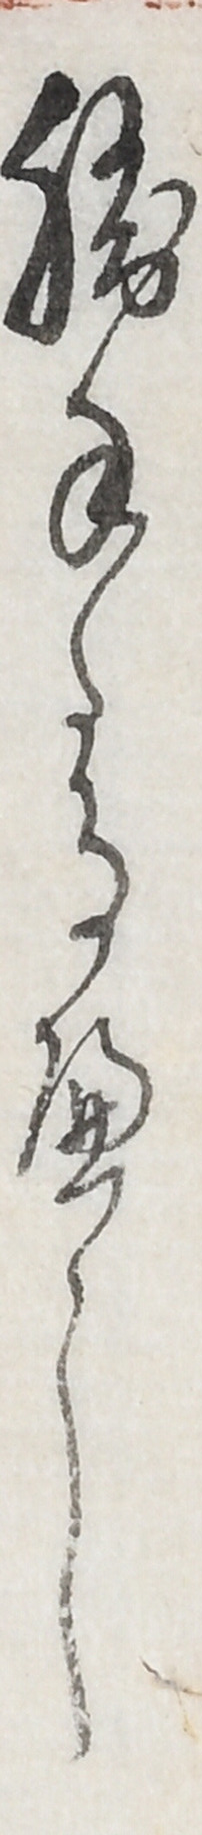勝手たるへし
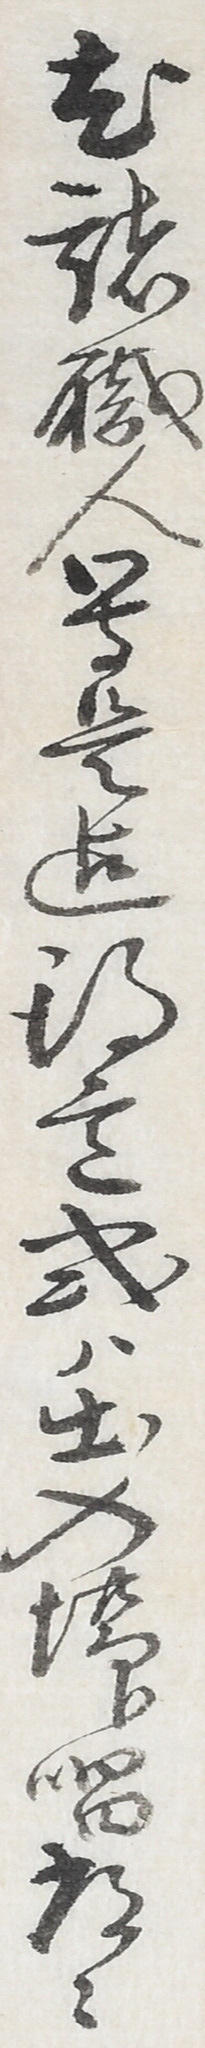尤諸職人等是迄得意或ハ出入場ト唱常々
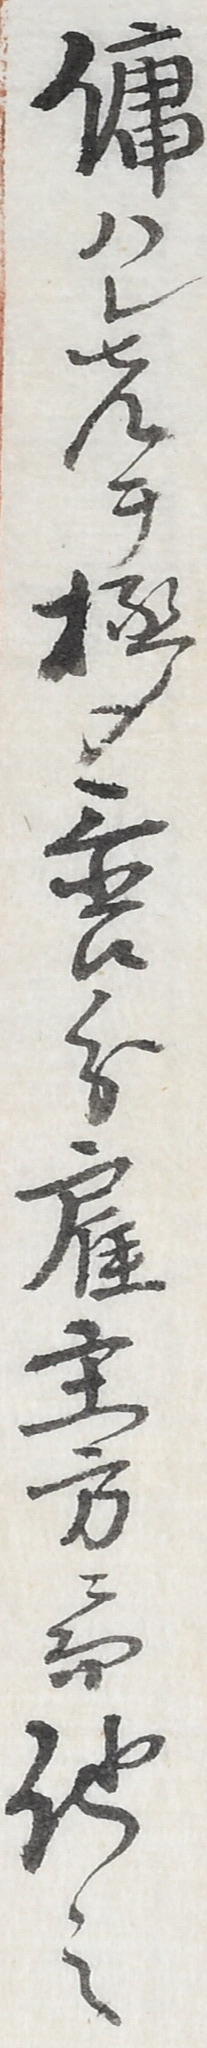傭ハレ先ヲ極メ置候分雇主方ニ而他之
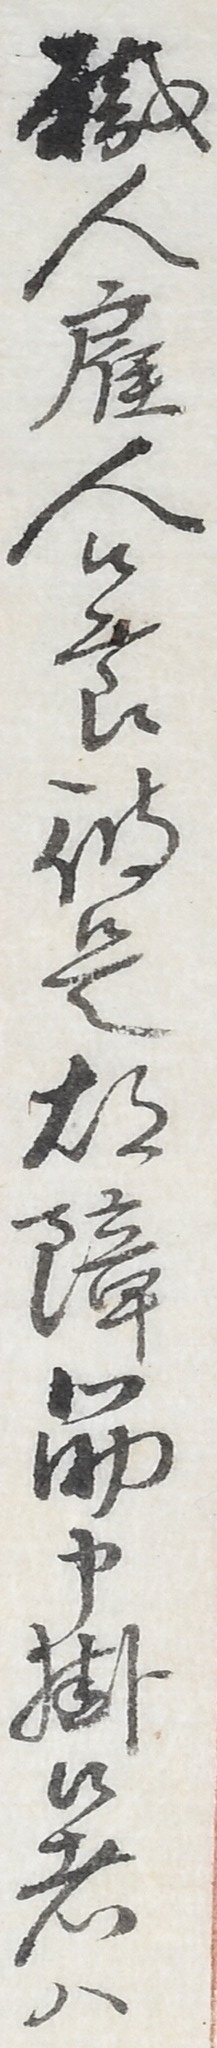職人雇人候節彼是故障筋申掛候者ハ
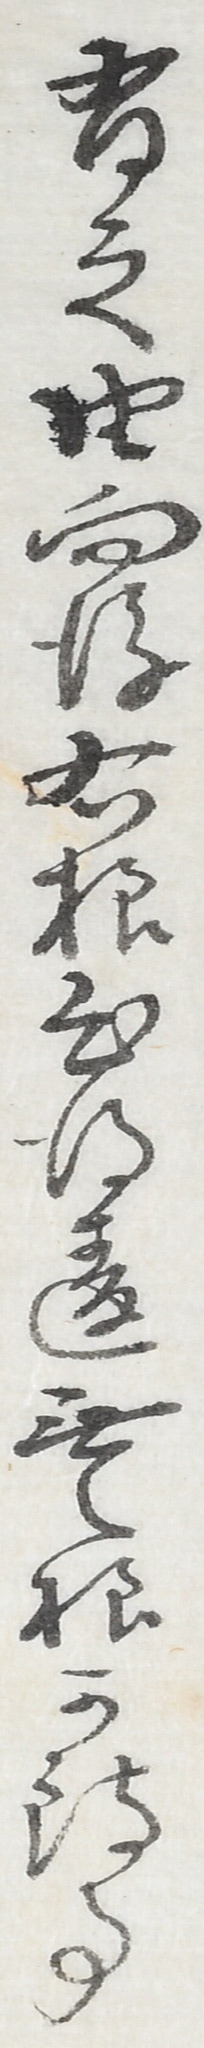有之由向後右様心得違無之様可致事
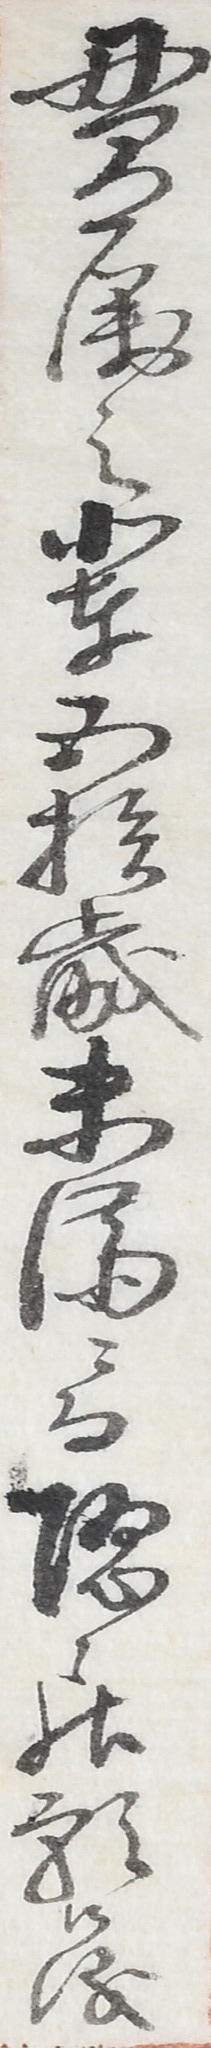貫属之輩五拾歳未満ニ而隠居願候儀
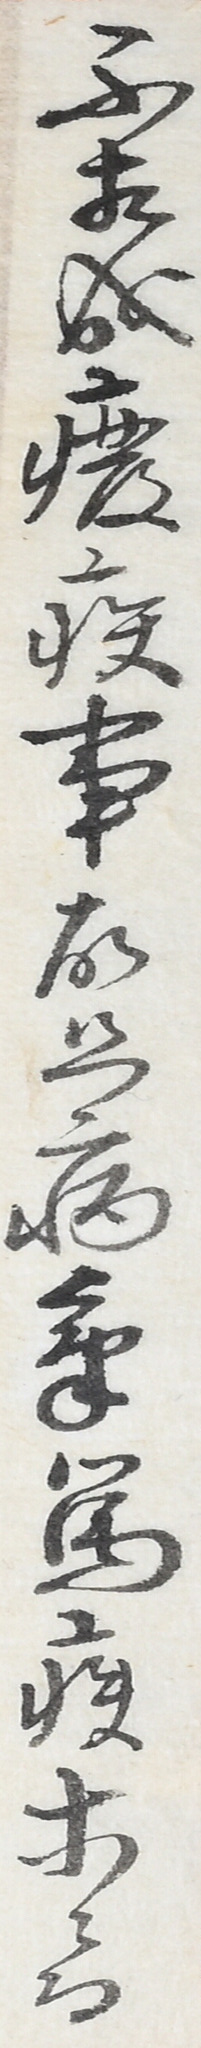不相成癈疾事故且病気篤疾等ニ而

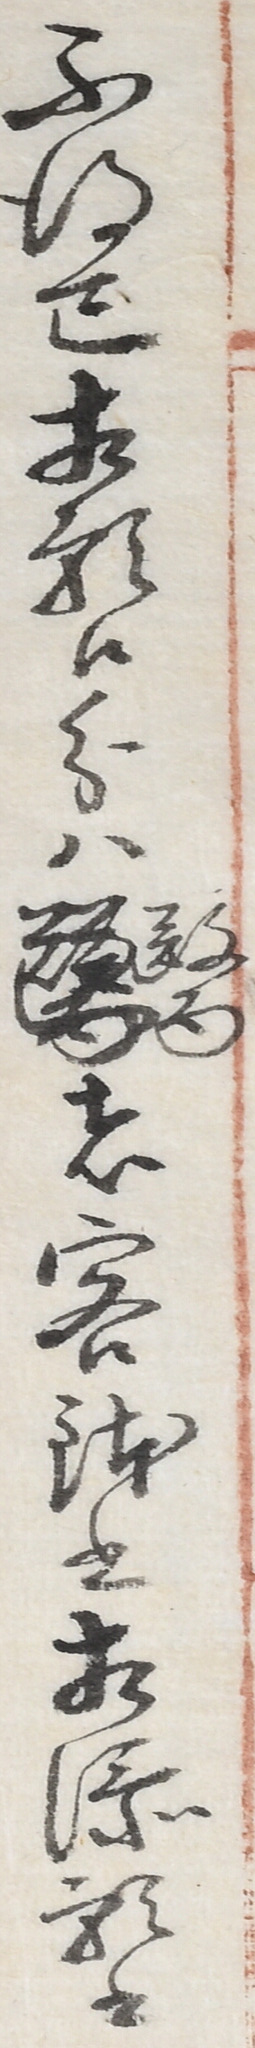不得已相願候分は医者容体書相添願書
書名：壹番・御布告一式
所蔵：伊那市立高遠町図書館・合同会社AMANE
